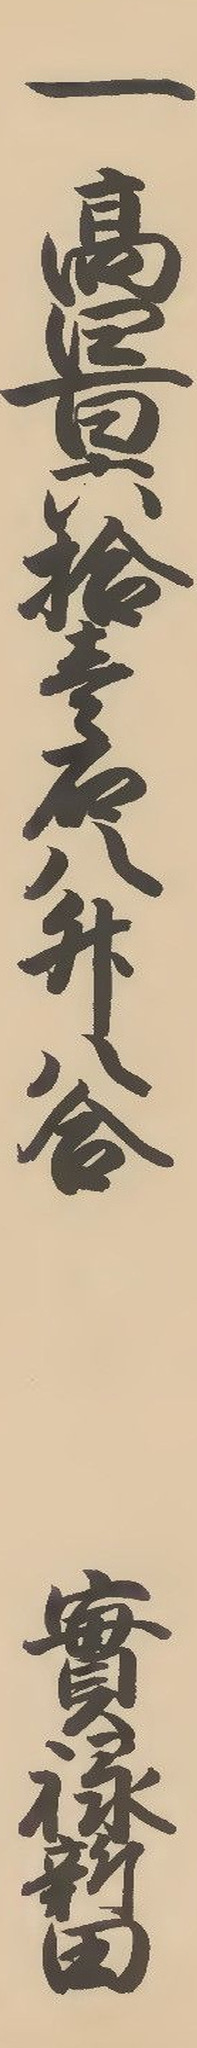一高四百六拾壱石八升八合実禄新田
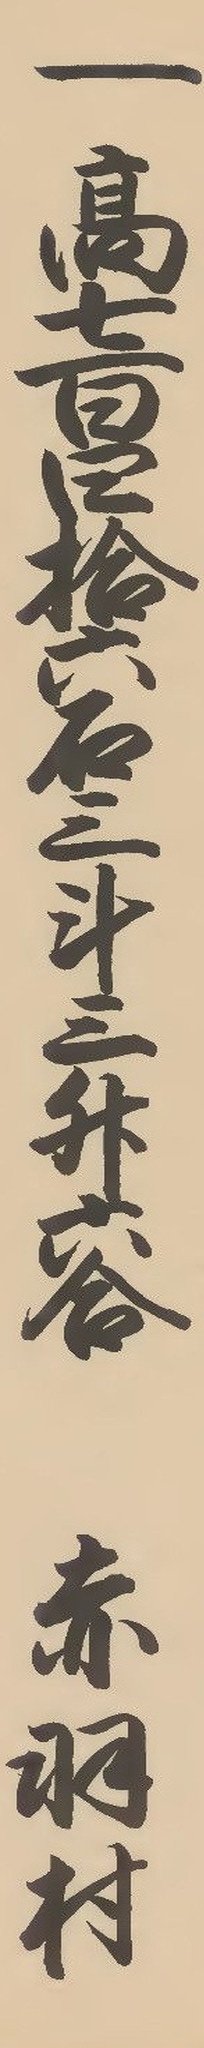一高七百四拾六石三斗三升六合赤羽村
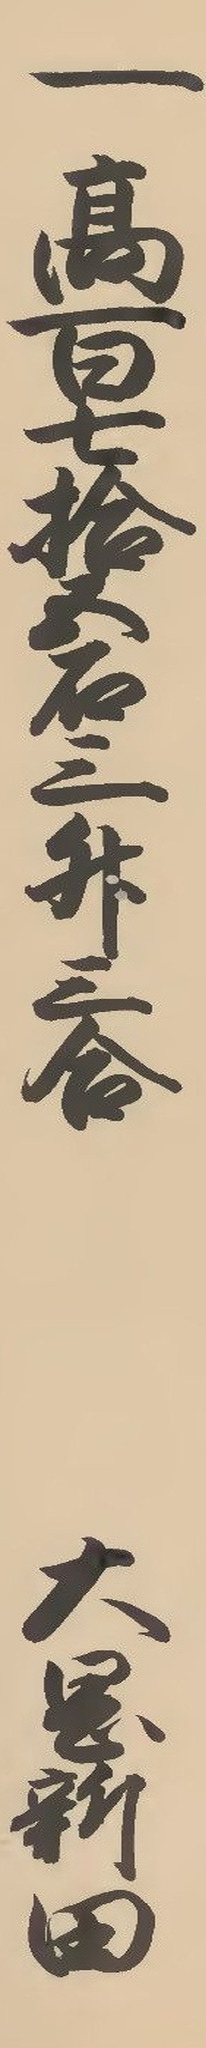一高百七拾五石三升三合大岡新田
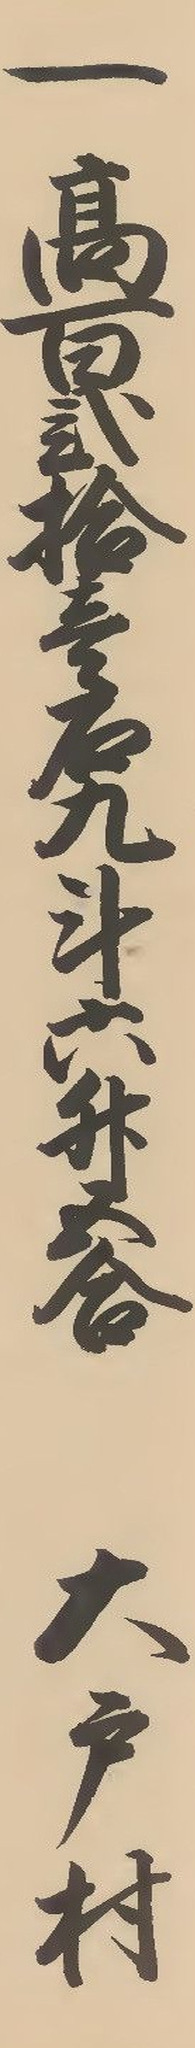一高百弐拾壱石九斗六升五合大戸村
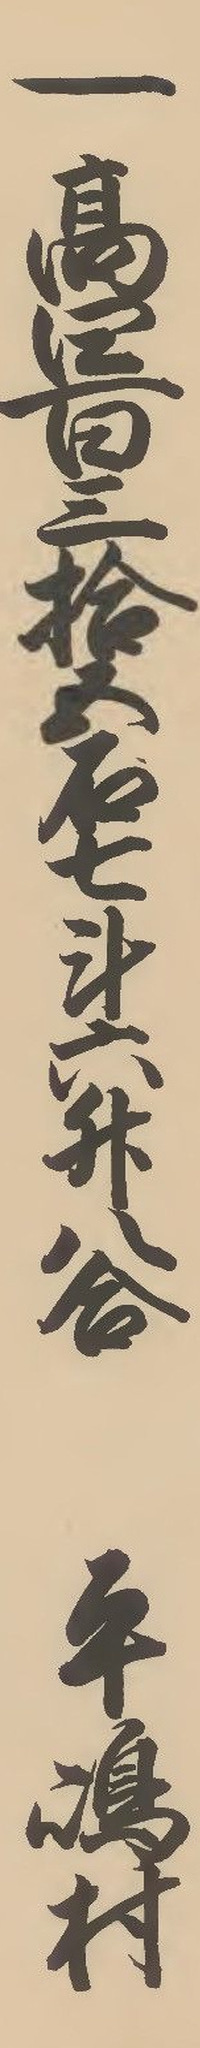一高四百三拾五石七斗六升八合平島村
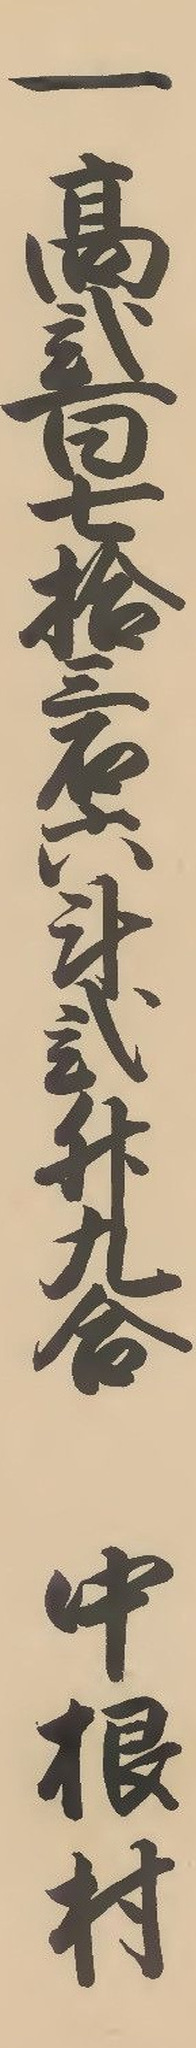一高弐百七拾三石六斗弐升九合中根村
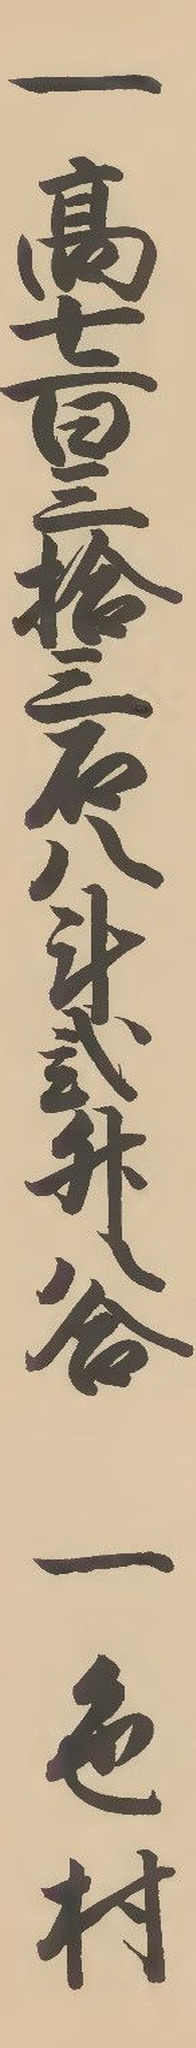一高七百三拾三石八斗弐升八合一色村

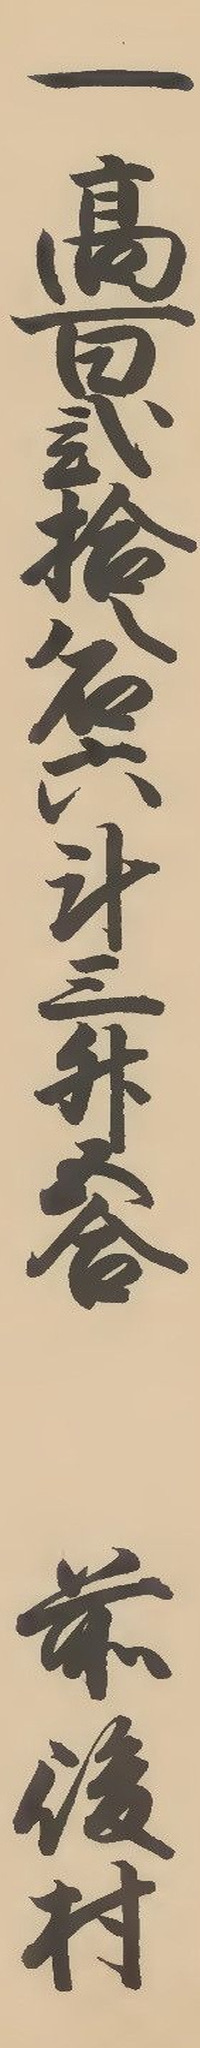一高百弐拾八石六斗三升五合前後村
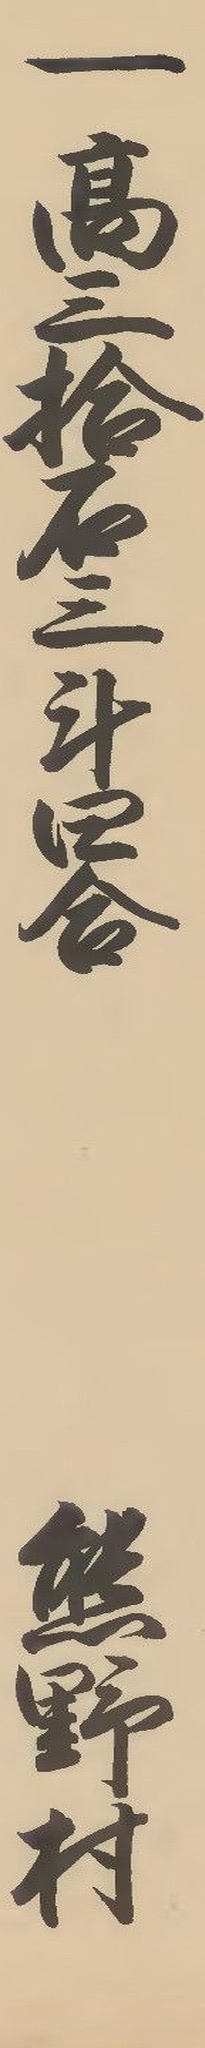一高三拾石三斗四合熊野村
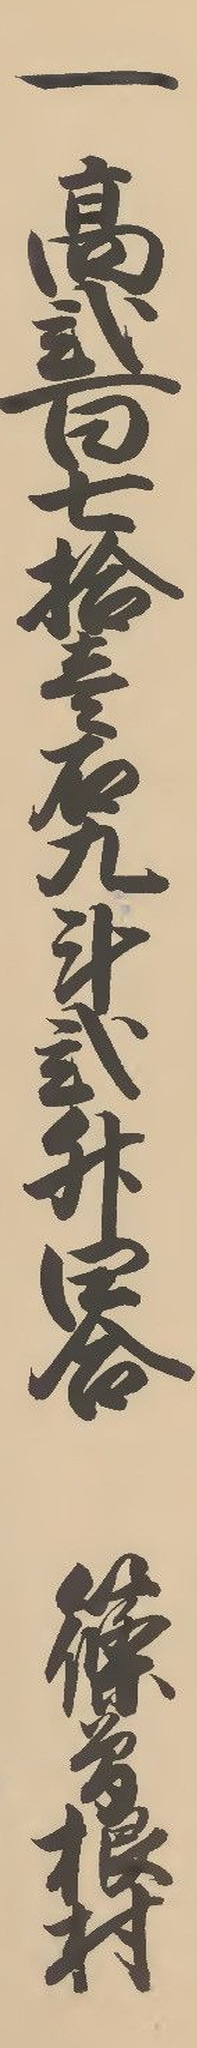一高弐百七拾壱石九斗弐升四合篠曽根村
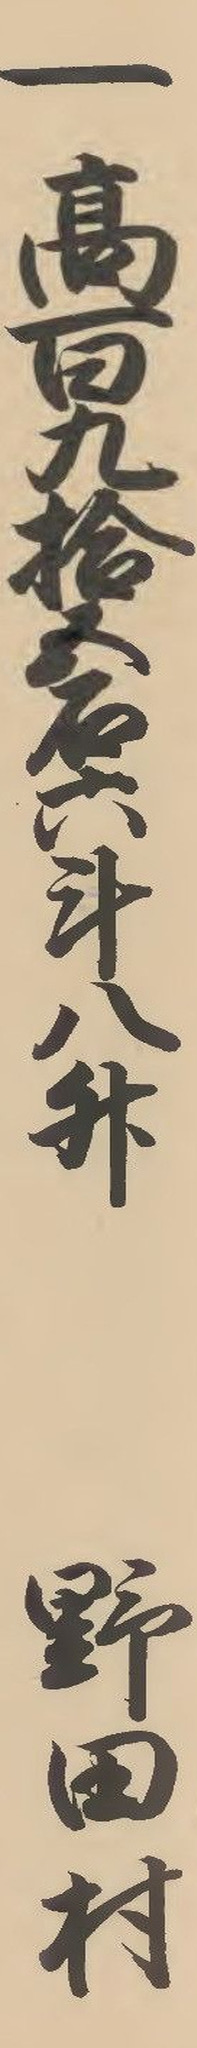一高百九拾五石六斗八升野田村
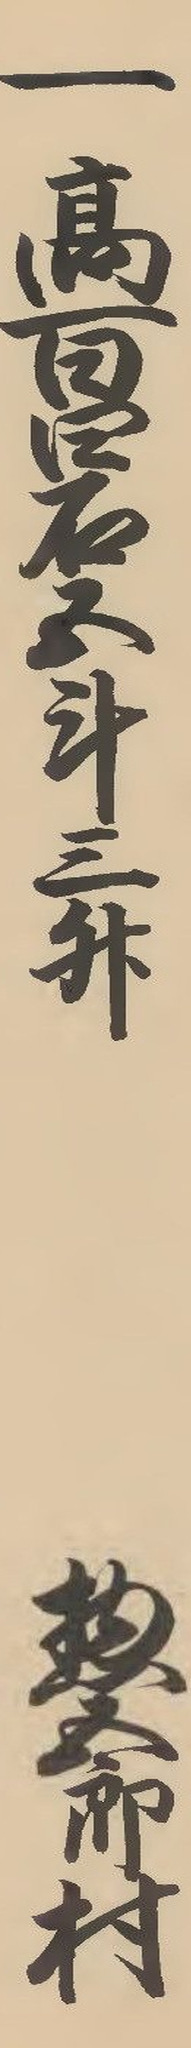一高百四石五斗三升惣五郎村
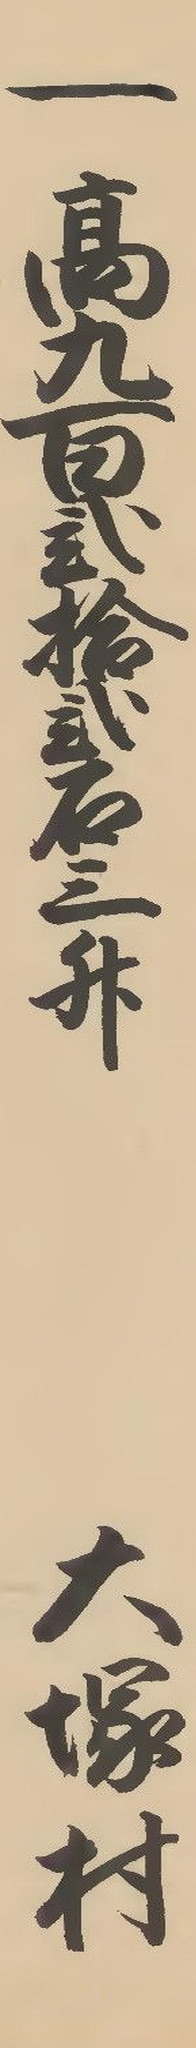一高九百弐拾弐石三升大塚村
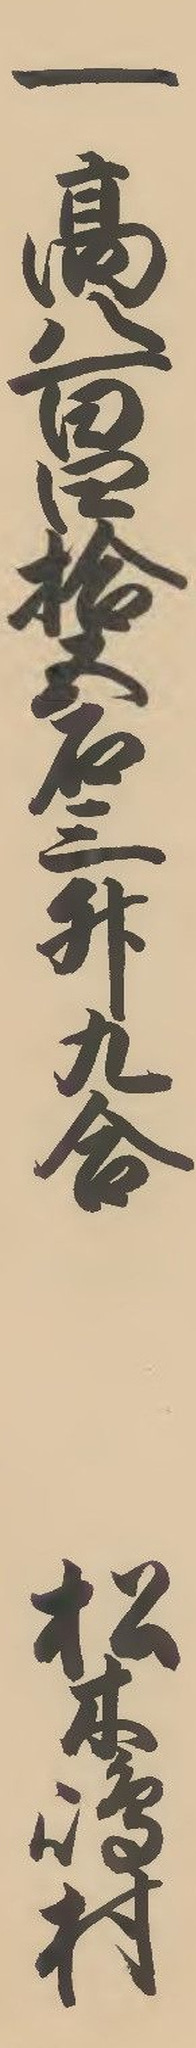一高八百四拾五石三升九合松木島村

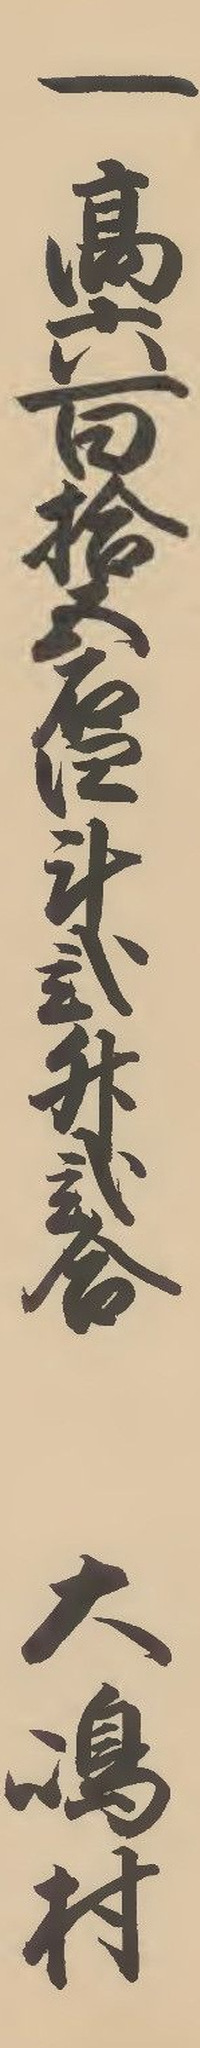一高六百拾五石四斗弐升弐合大島村
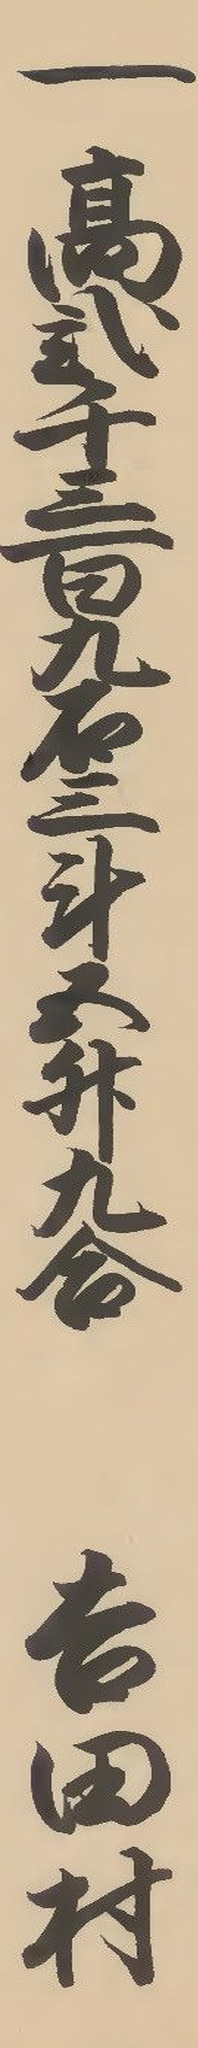一高弐千三百九石三斗五升九合吉田村
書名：三河国郷帳
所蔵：国立公文書館 National Archives of Japan
